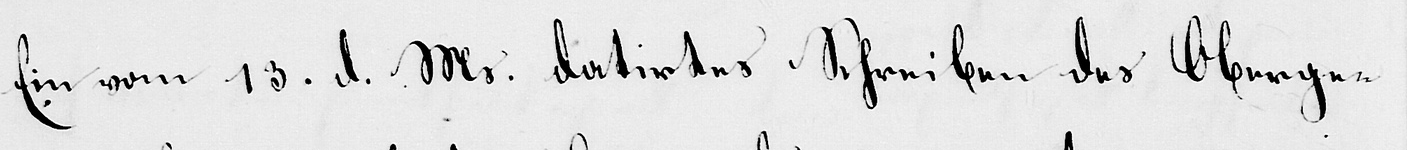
Ein vom 13. d. Ms. datirtes Schreiben des Oberge¬
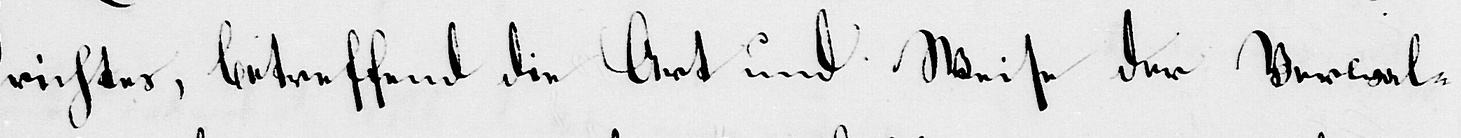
richtes, betreffend die Art und Weise der Verwal¬
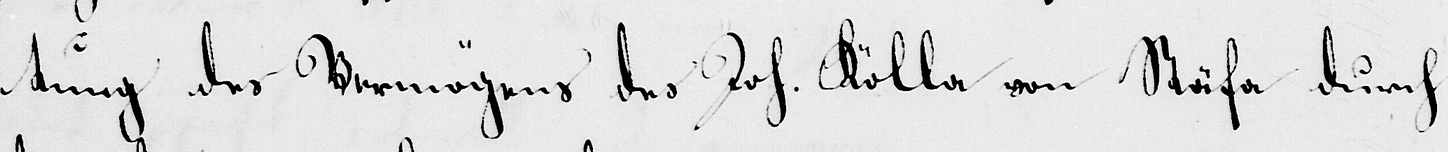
tung des Vermögens des Joh. Kölla von Stäfa durch
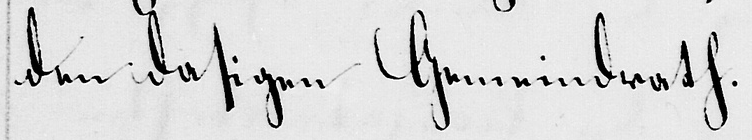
den dasigen Gemeindrath.
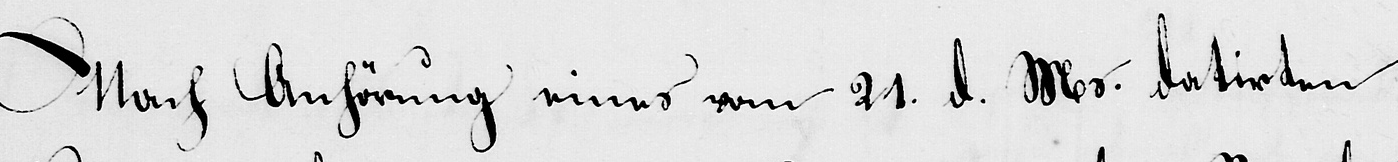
Nach Anhörung eines vom 21. d. Ms. datirten
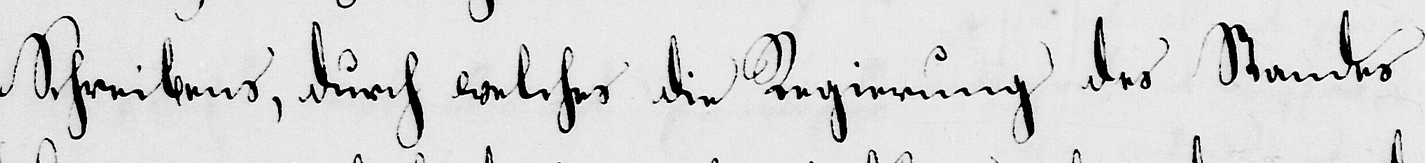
Schreibens, durch welches die Regierung des Standes
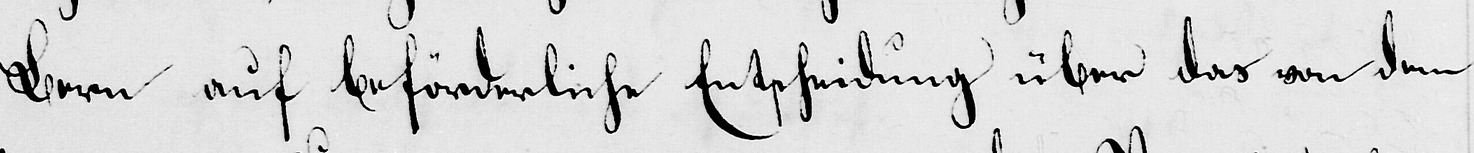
Bern auf beförderliche Entscheidung über das von dem
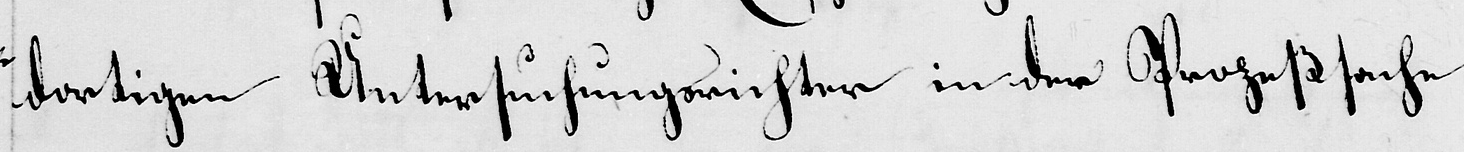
dortigen Untersuchungsrichter in der Prozeßsache
